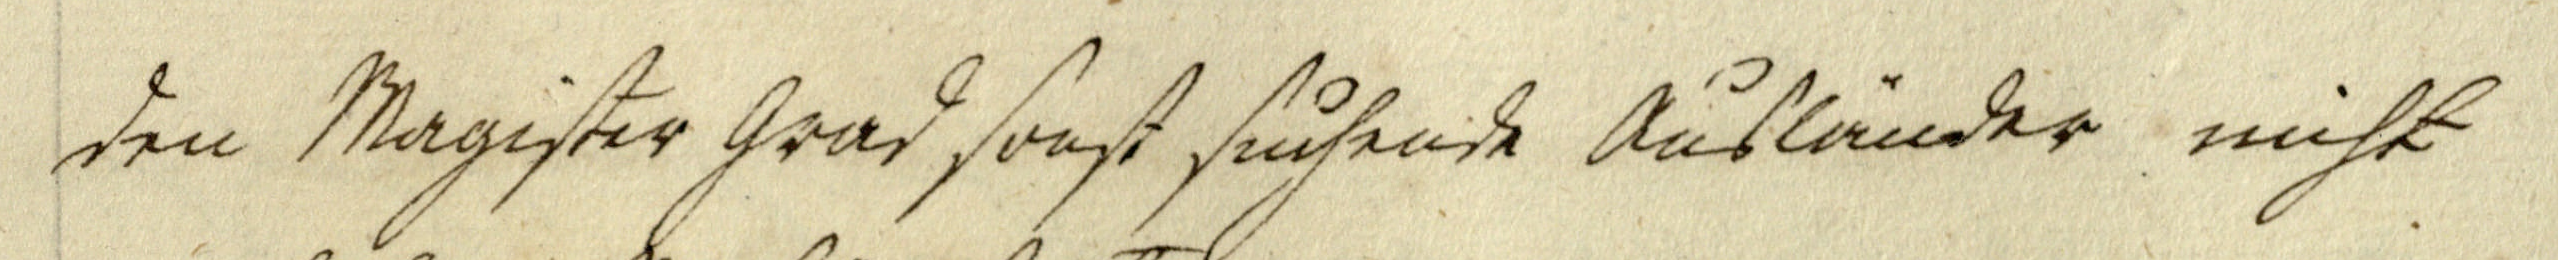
den Magister Grad sonst suchende Ausländer nicht
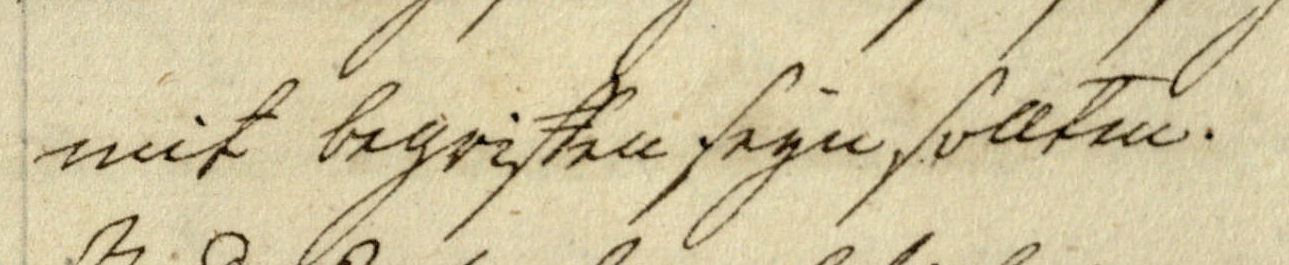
mit begriffen seÿn sollten.
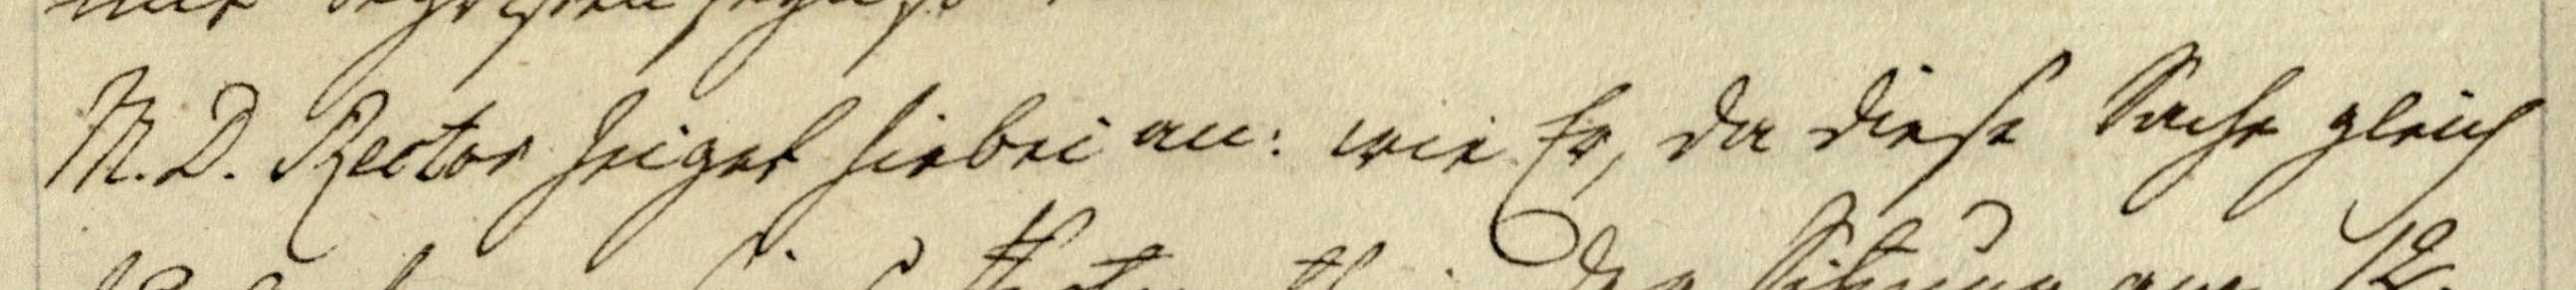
M. D. Rector zeiget hiebei an: wie Er, da diese Sache gleich
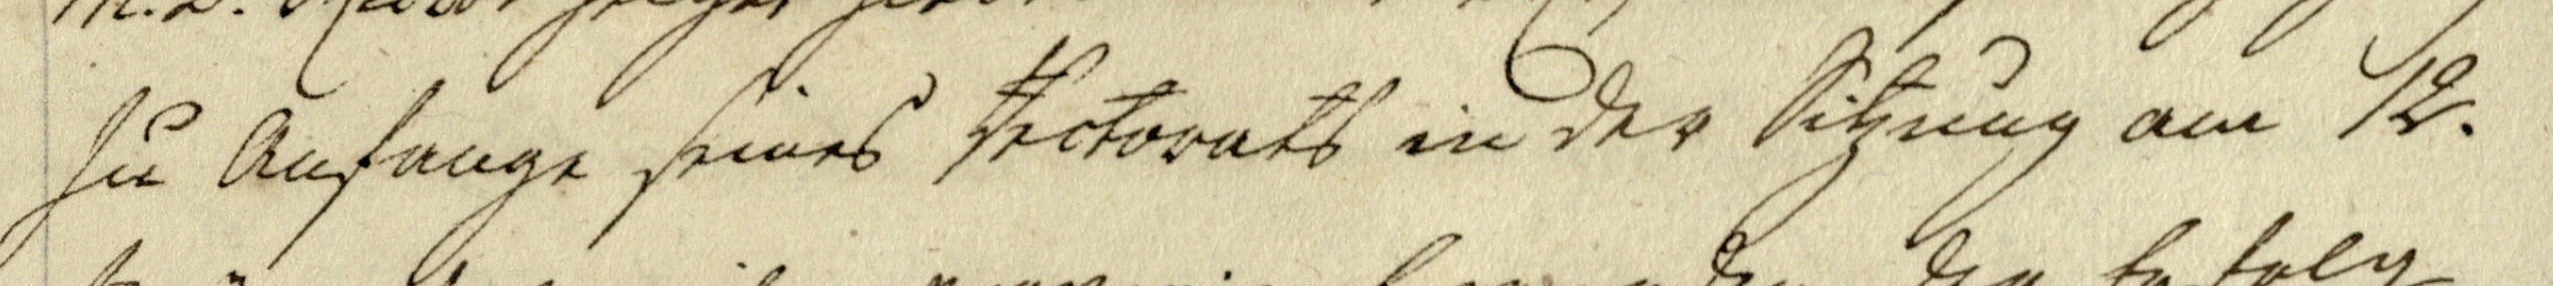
zu Anfange seines Rectorats in der Sitzung am 12.
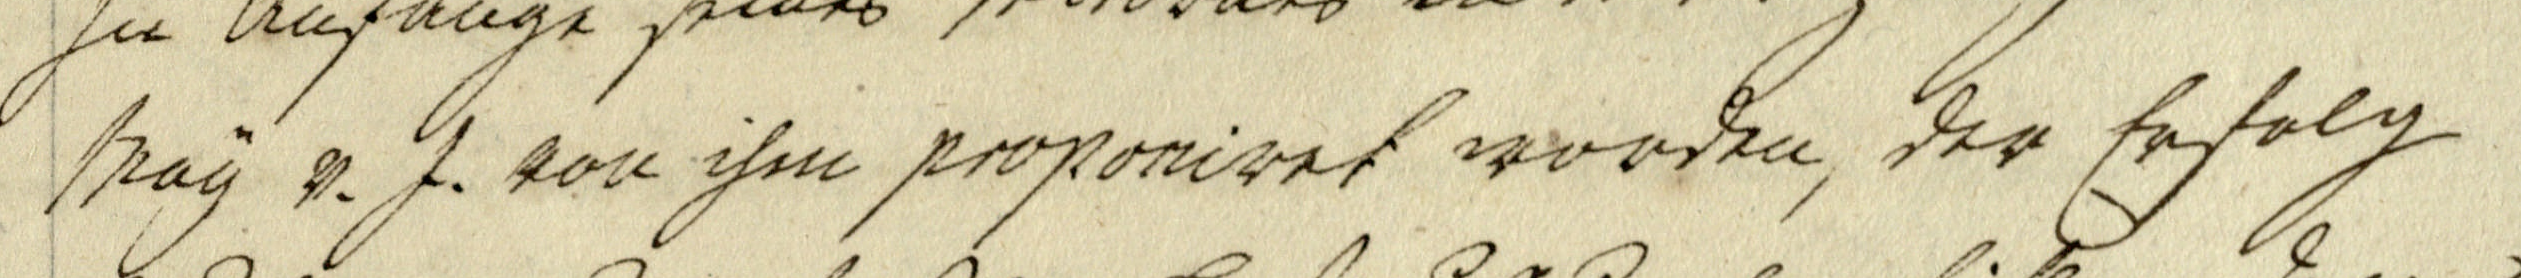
Maÿ v. J. von ihm proponiret worden, der Erfolg
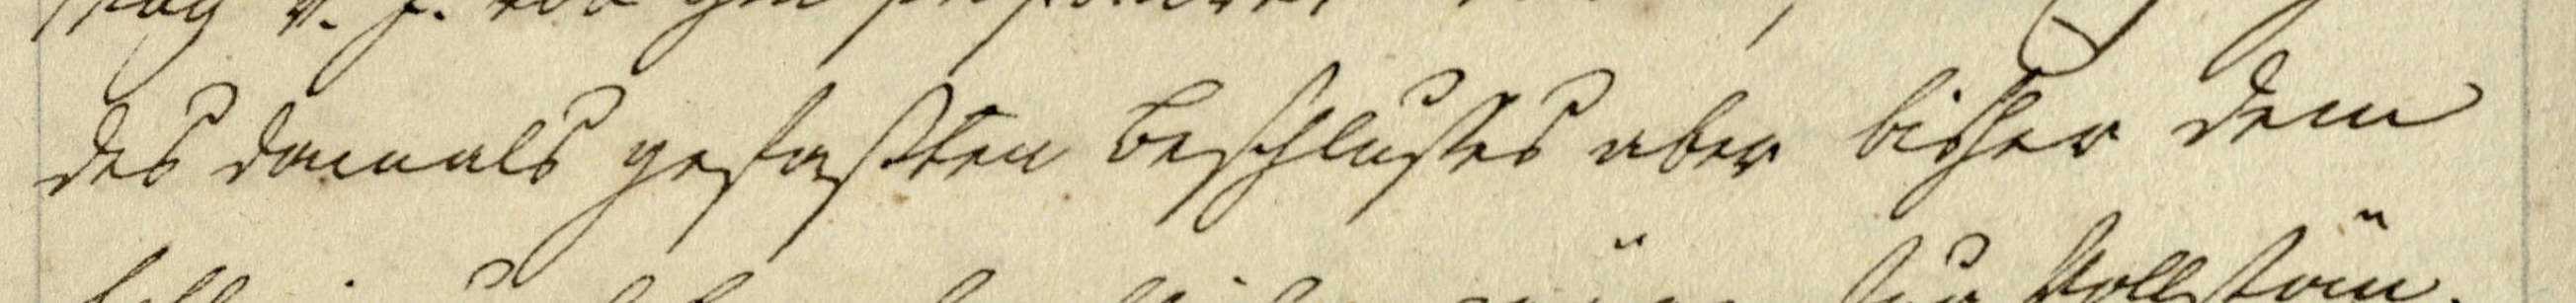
des damals gefaßten Beschlusses aber bisher dem
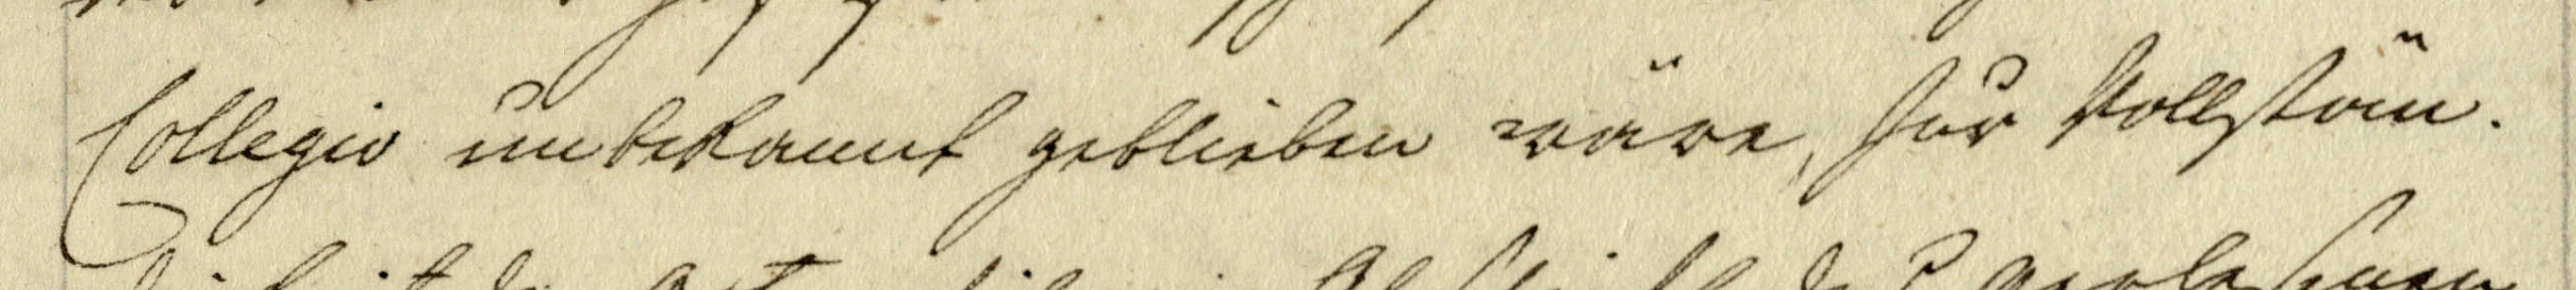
Collegio unbekannt geblieben wäre, zur Vollstän¬
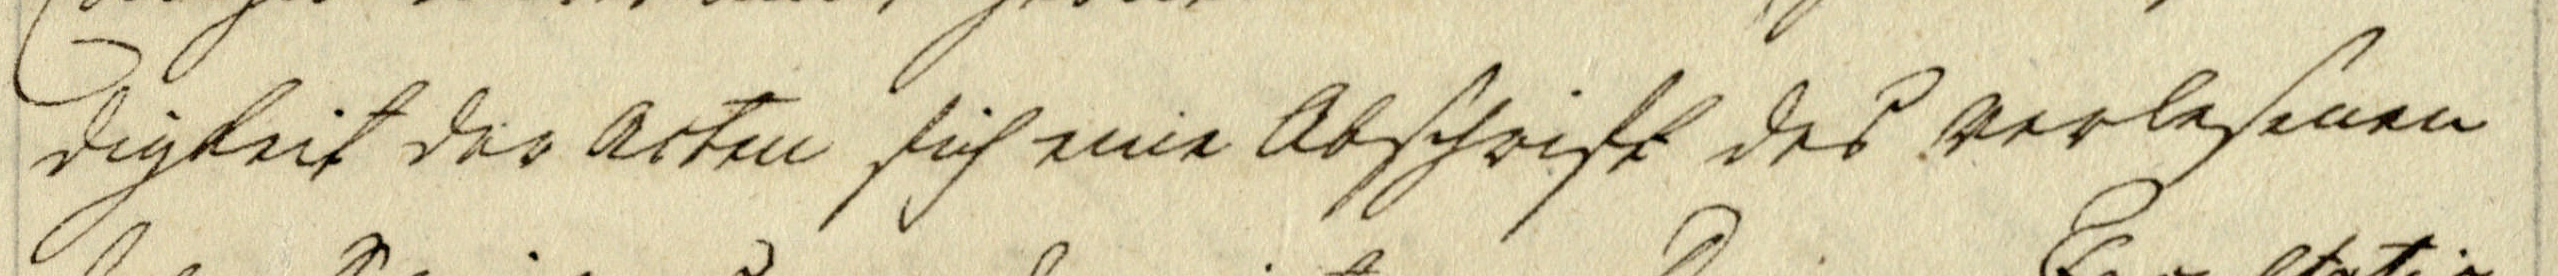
digkeit der Acten sich eine Abschrift des verlesenen
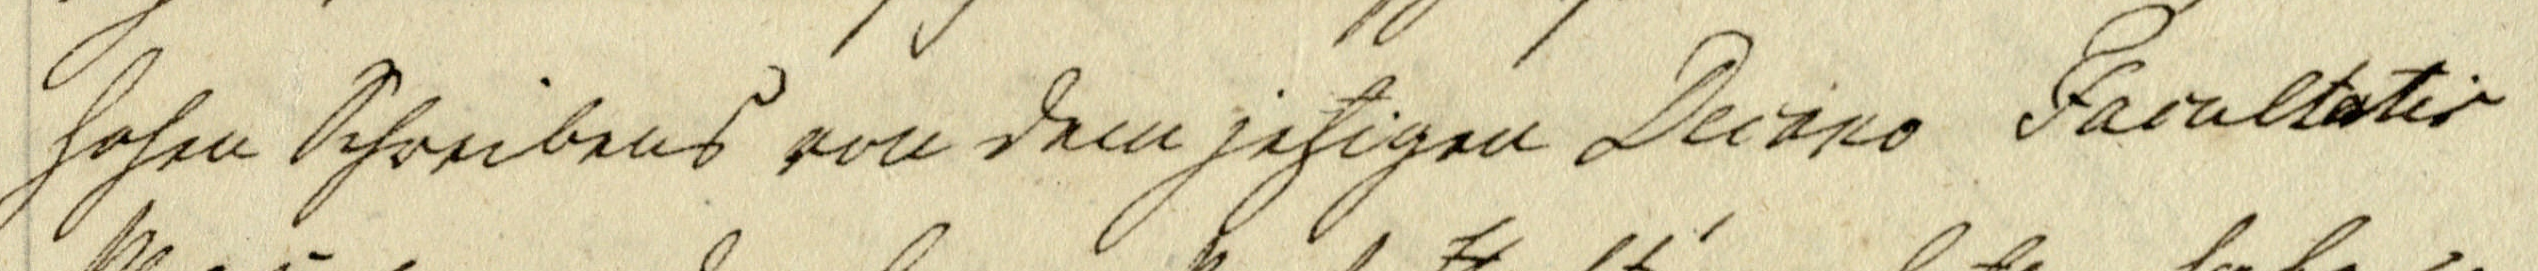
hohen Schreibens von dem jetzigen Decano Facultatis
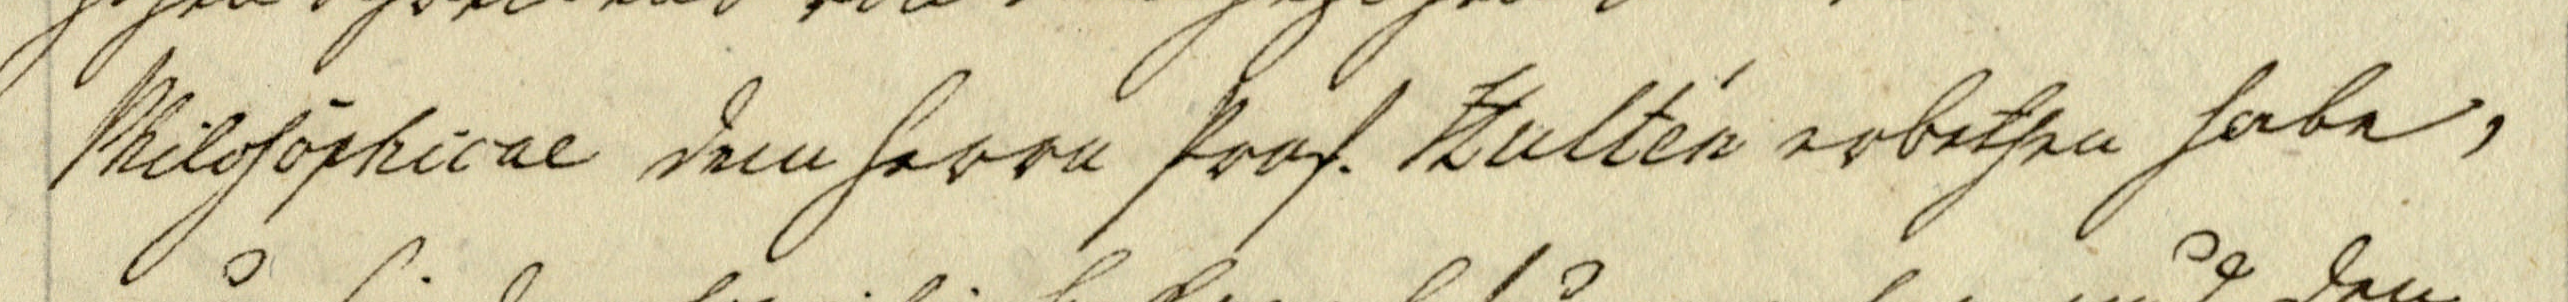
Philosophicae dem Herrn Prof. Hultén erbethen habe,
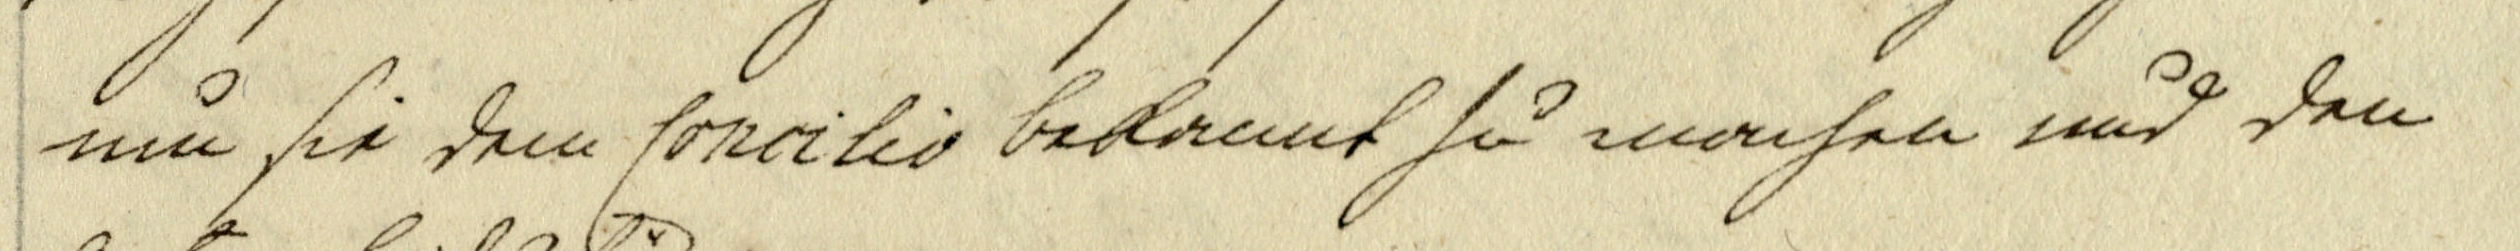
um sie dem Concilio bekannt zu machen und den
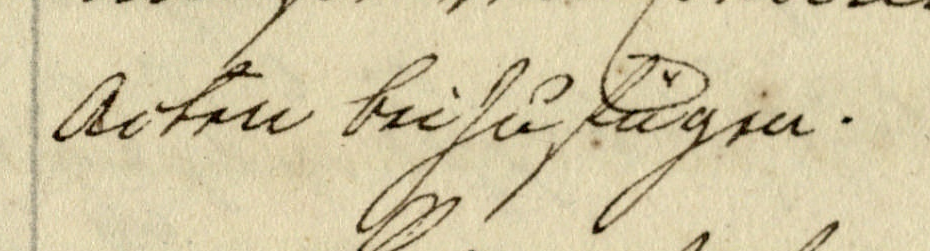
Acten beizufügen.
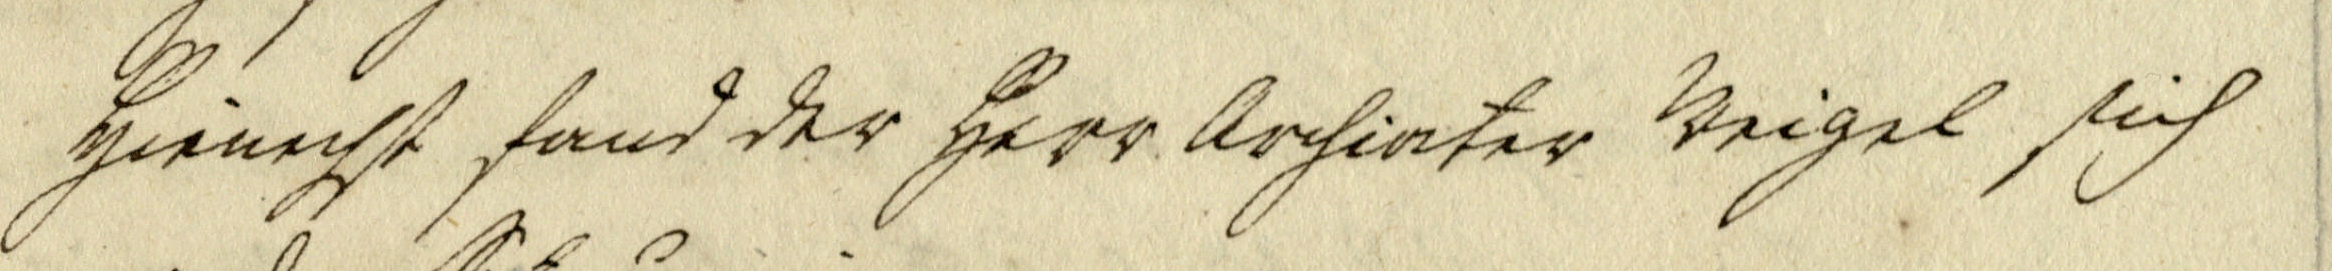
Hienechst fand der Herr Archiater Weigel sich
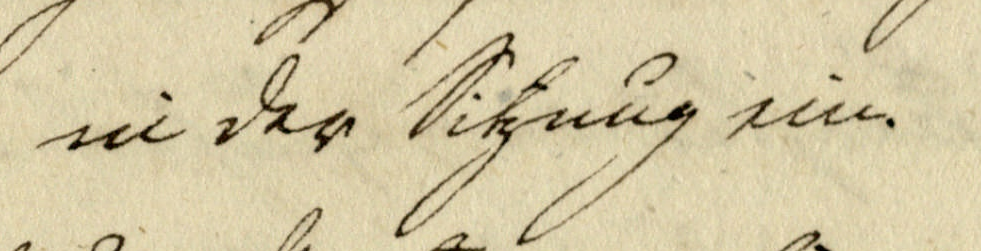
in der Sitzung ein.
